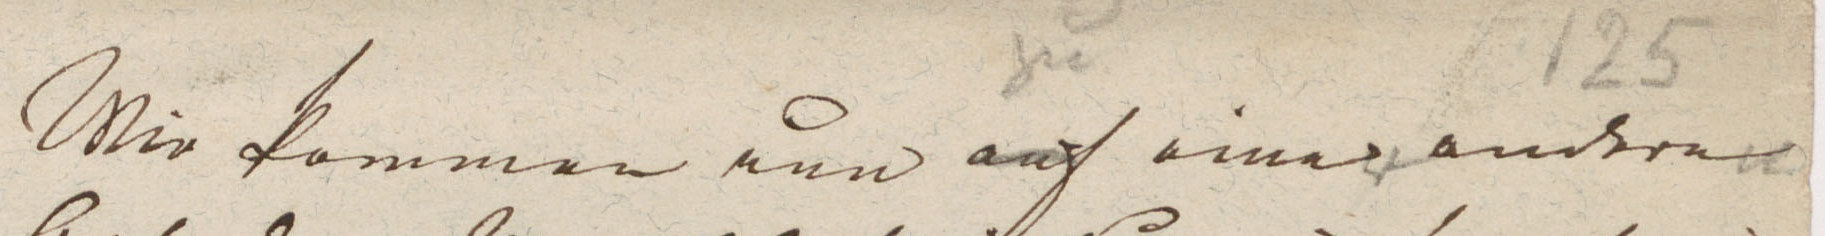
Wir kommen nun auf zu einer anderen
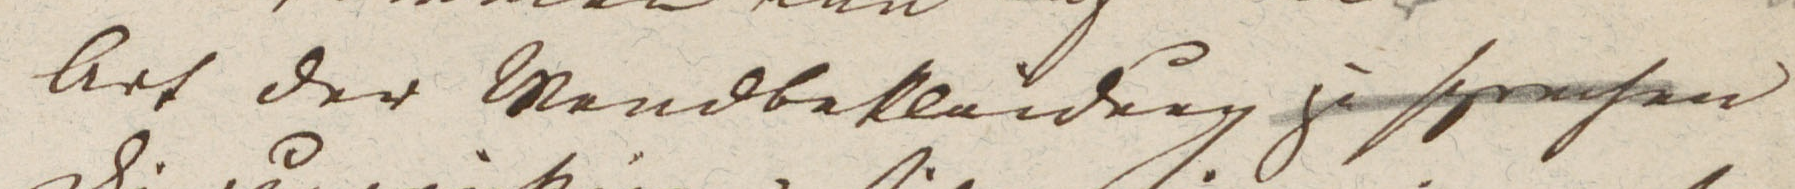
Art der Wandbekleidung zu sprechen
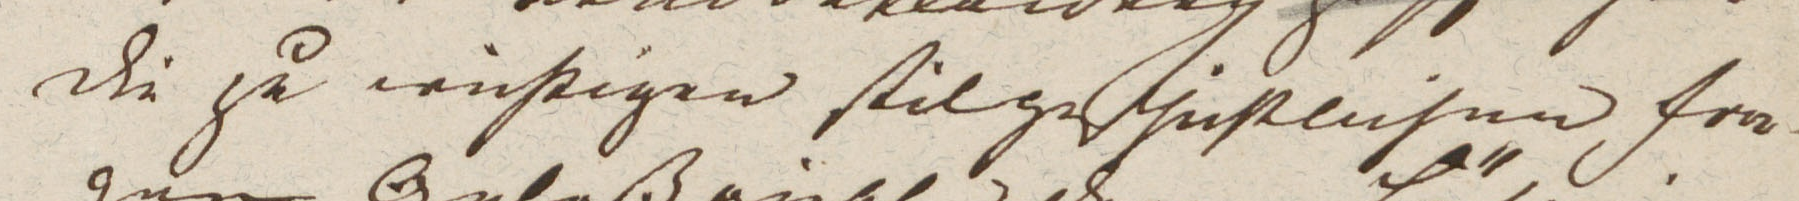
die zu wichtigen stilgeschichtlichen Fra-
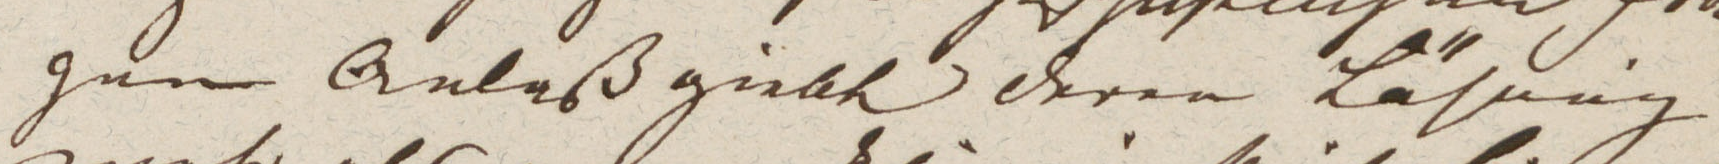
gen Anlass giet deren Lösung
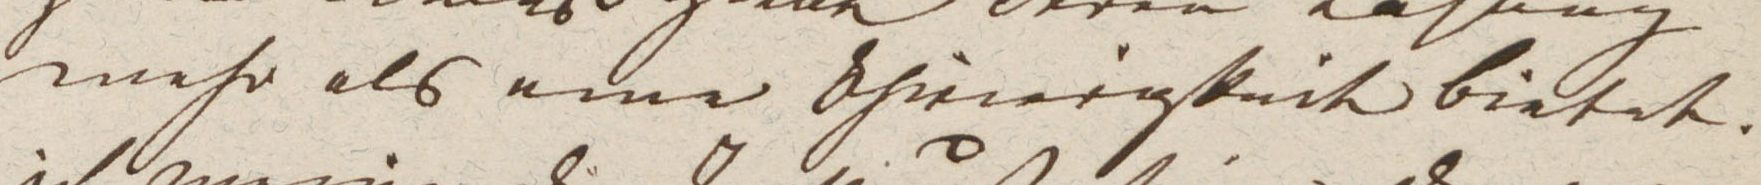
mehr als eine Schwierigkeit bietet.
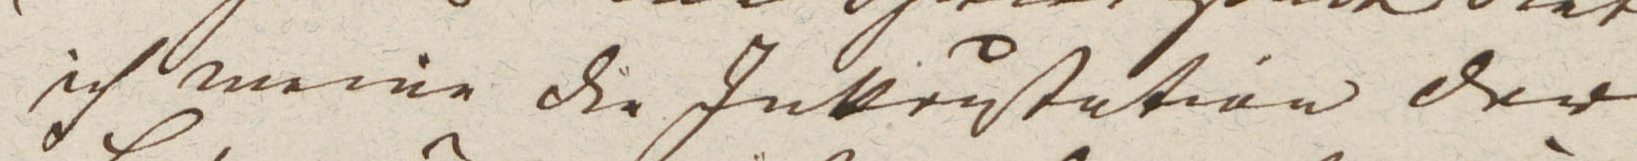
ich meine die Inkrustation der
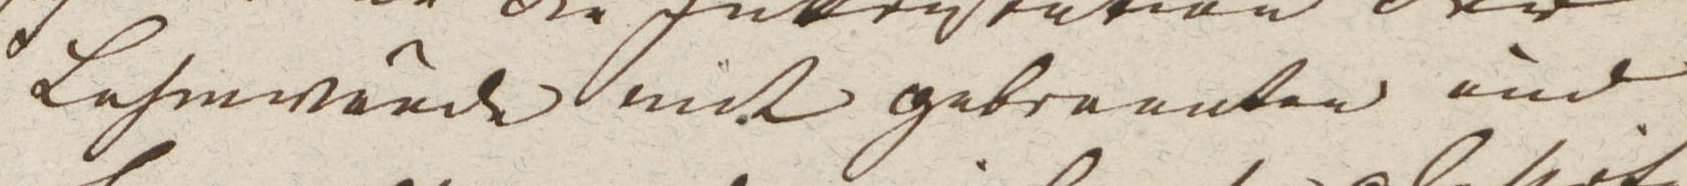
Lehmwände mit gebrannten und
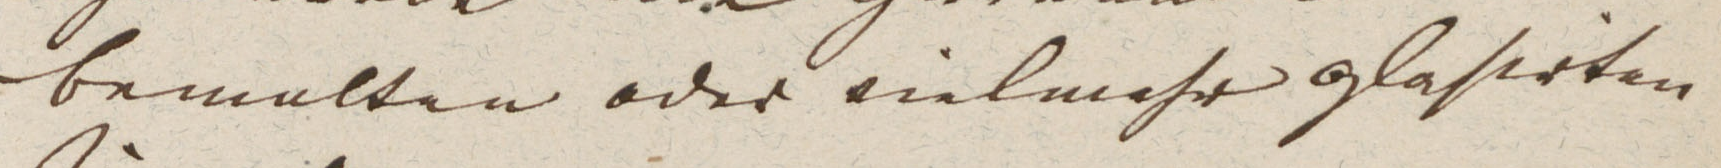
bemalten oder vielmehr glasirten
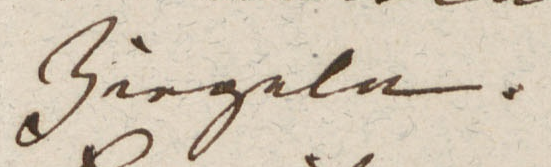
Ziegeln.
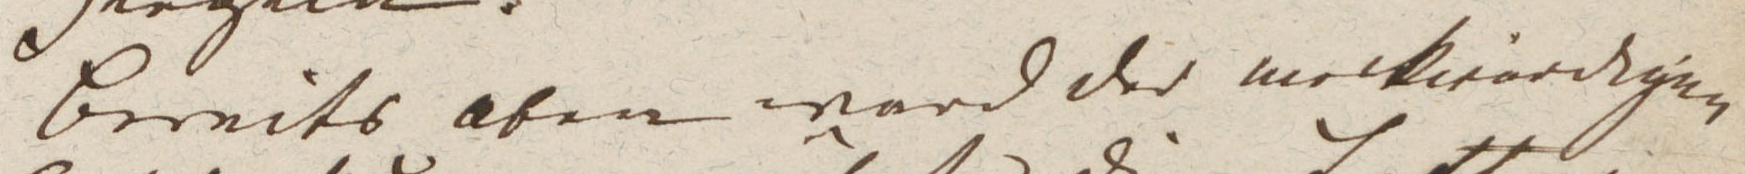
Bereits oben ward der merkwürdigen
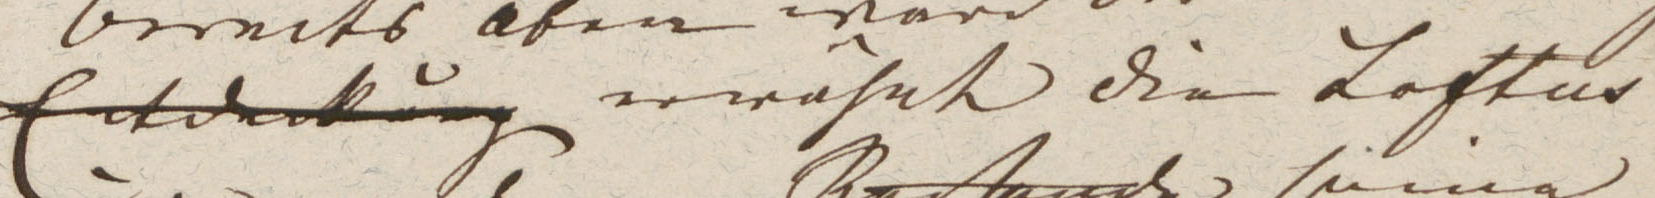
Entdeckung erwähnt die Loftus
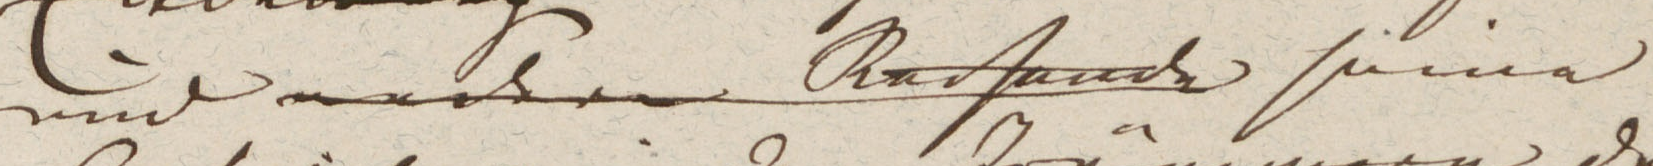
und andere Reisende seine
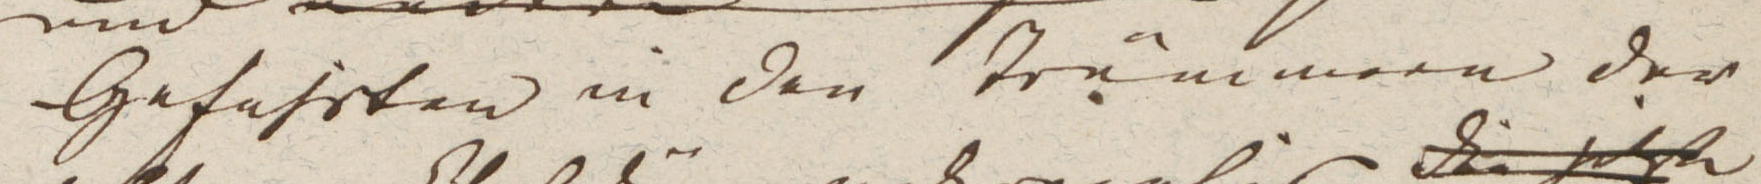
Gefährten in den Trümmern der
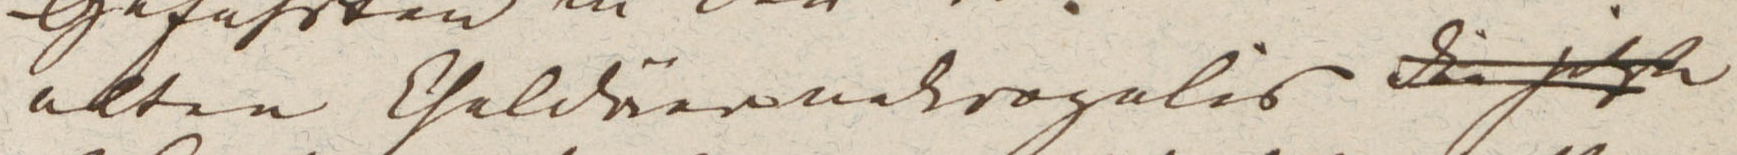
alten Chaldäernekropolis die jetzt
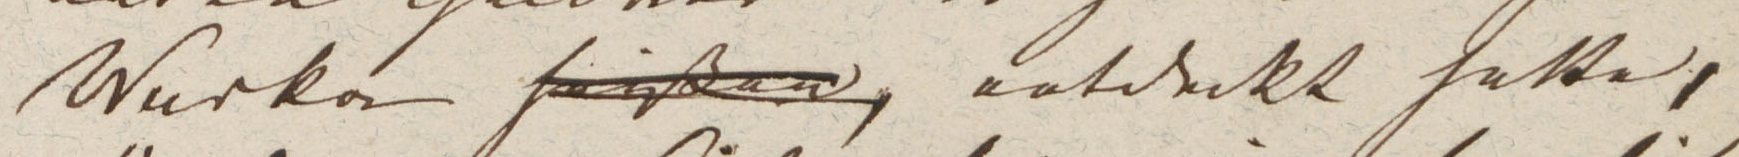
Wurka heissen, entdeckt hatte,
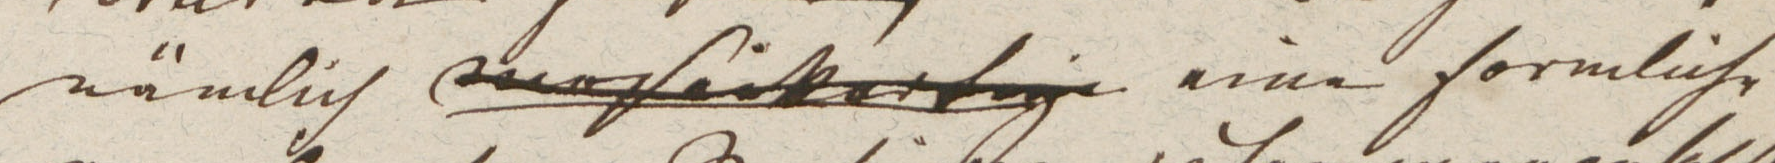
nämlich mosaikartige eine formliche
